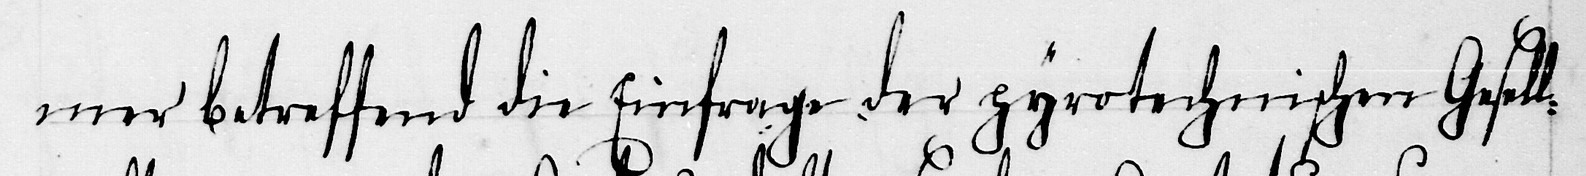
mer betreffend die Einfrage der pyrotechnischen Gesel¬
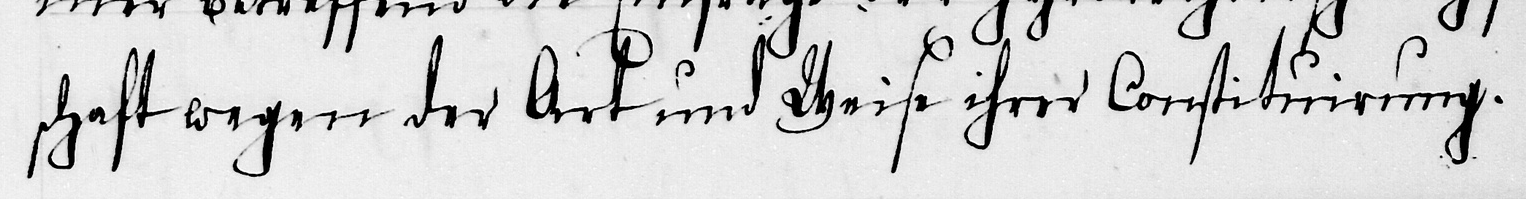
schaft wegen der Art und Weise ihrer Constituirung.
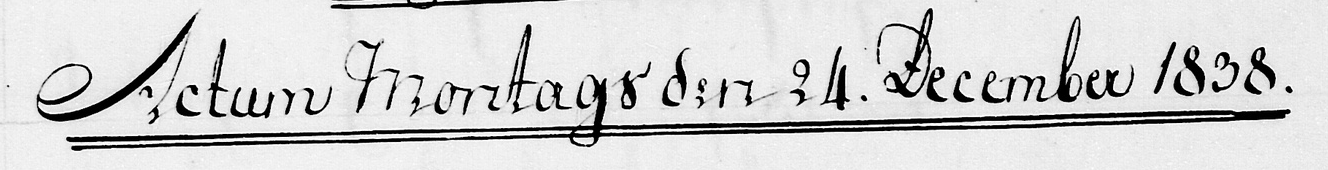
Actum Montags den 24. December 1838.
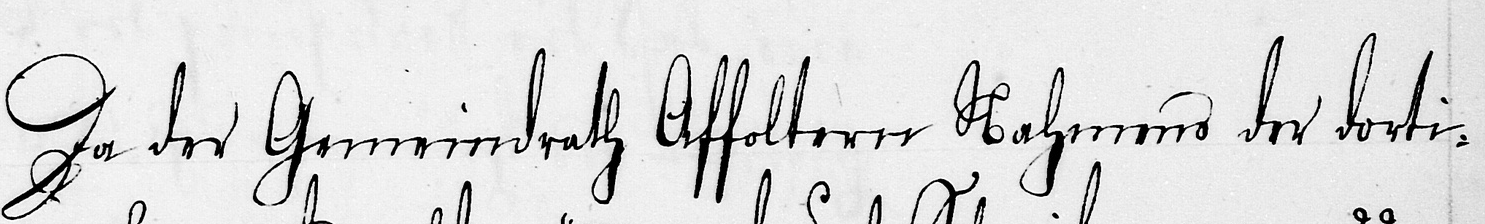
Da der Gemeindrath Affoltern Nahmens der dorti¬
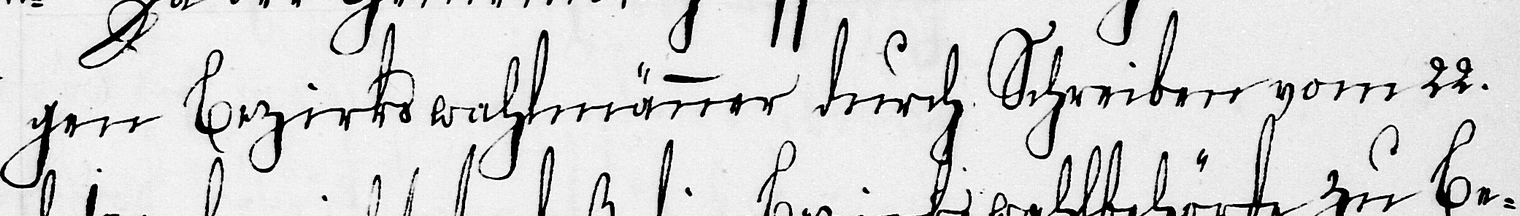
gen Bezirkswahlmänner durch Schreiben vom 22.
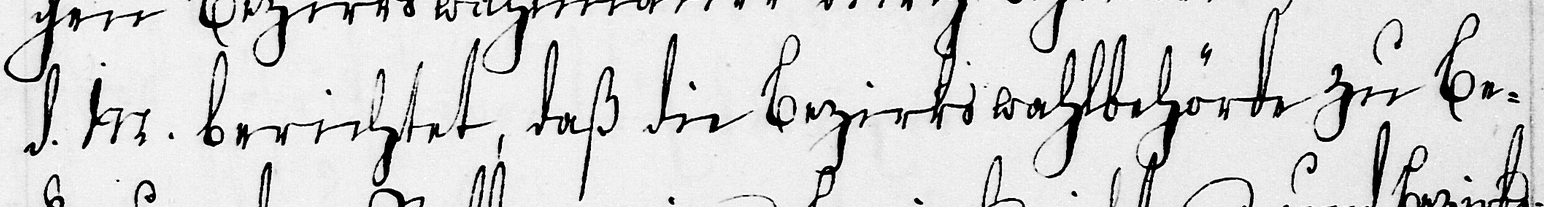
d. M. berichtet, daß die Bezirkswahlbehörde zu Be¬
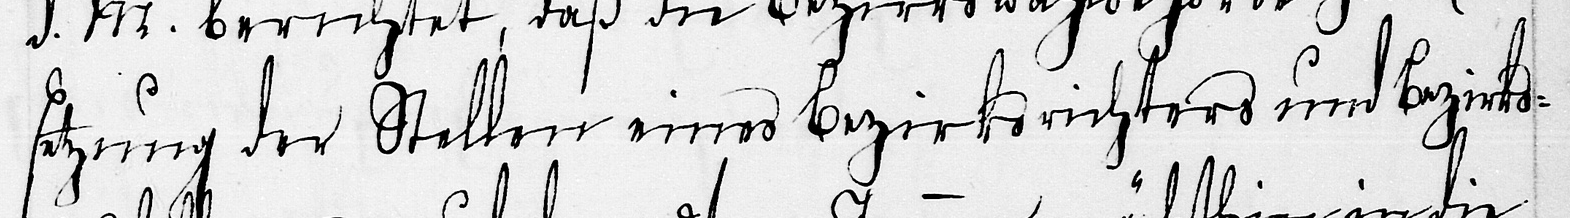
setzung der Stellen eines Bezirksrichters und Bezirks¬
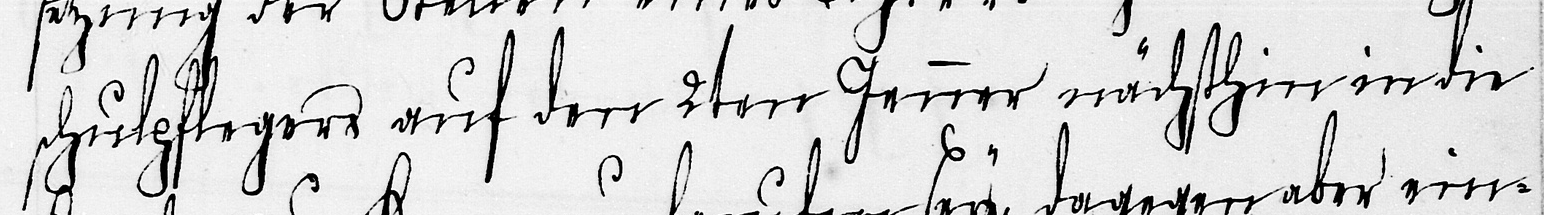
schulpflegers auf den 2ten Jenner nächsthin in die
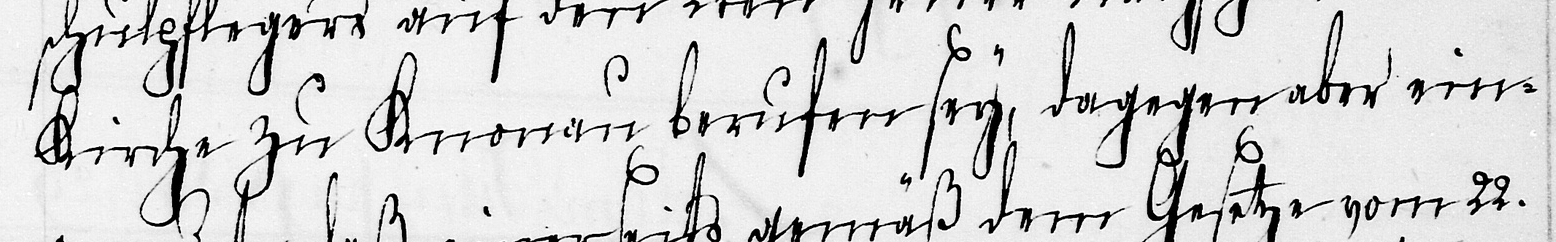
Kirche zu Knonau berufen sey, dagegen aber ein¬
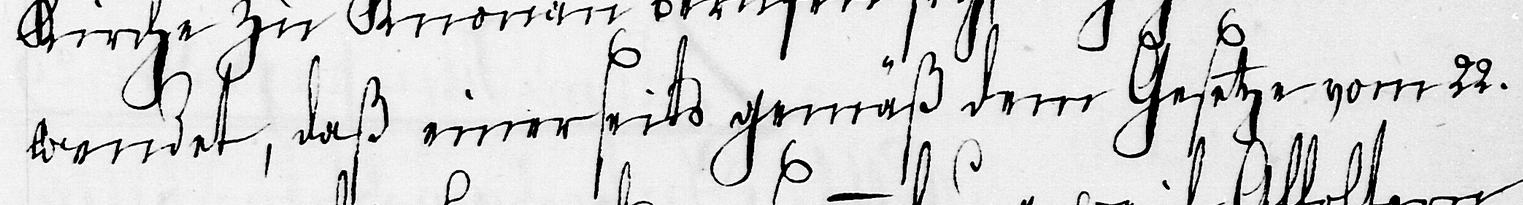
wendet, daß einerseits gemäß dem Gesetze vom 22.
